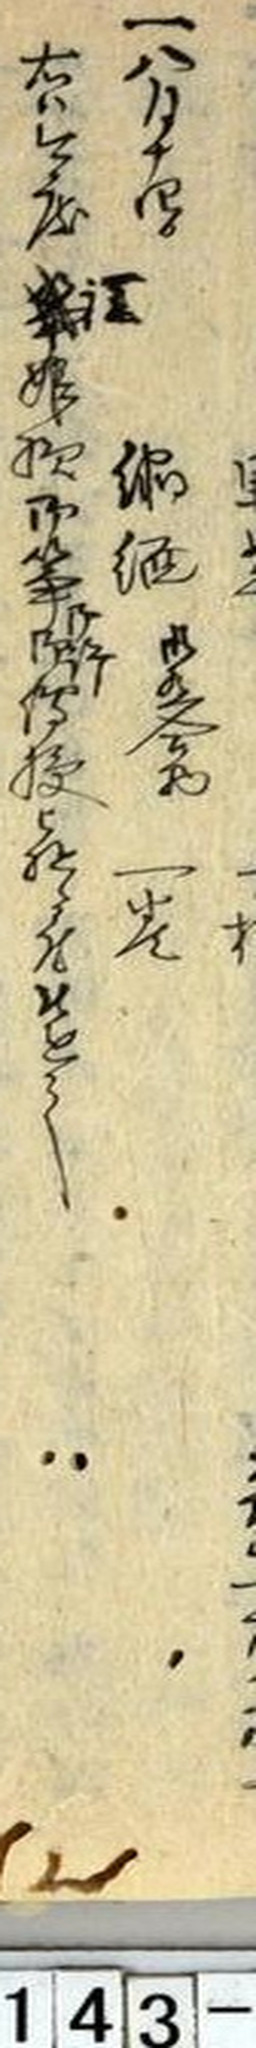右ハ今度謹姫様御箏御御伝授被遊候付被進之
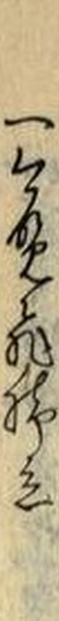一今晩飛脚立
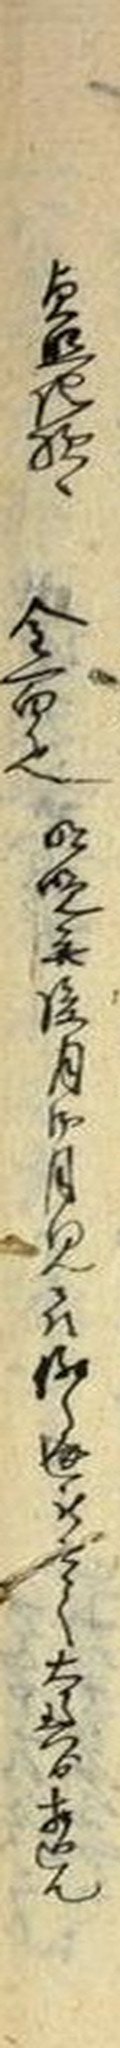貞照院様へ金百疋明晩并後月御月見ニ付例之通被進之大奥ゟ相廻ル
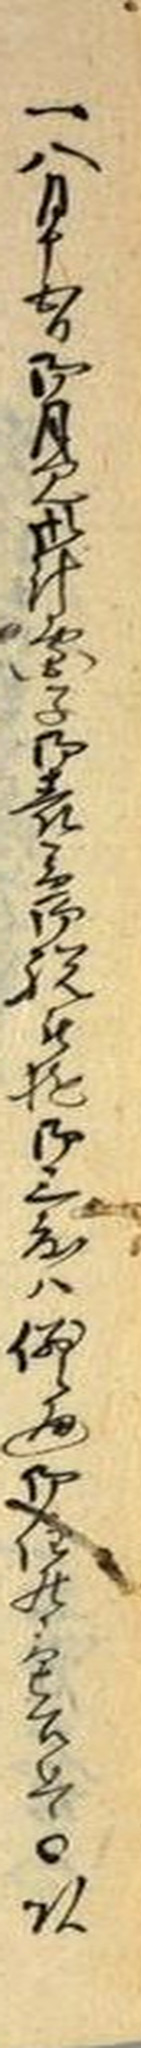一八月十五日御月見御汁団子御表ニ而御祝被遊御三度ハ例之通御住居ニ而被召上候○頂
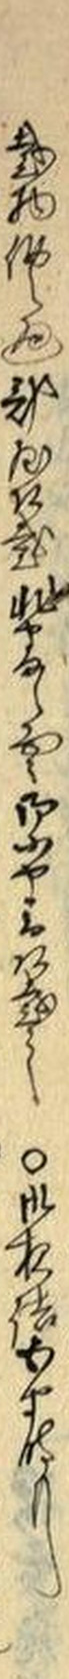戴物例之通部屋頂戴此番之面々御小屋ニ而頂戴之〇御夜詰五半時引
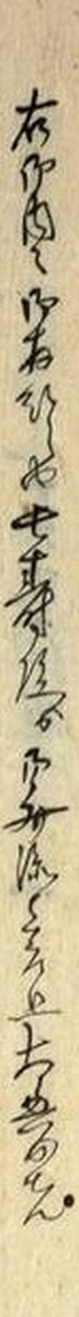右御内々御拝領候由長寿殿ゟ御文添被差上大奥ゟ出ル
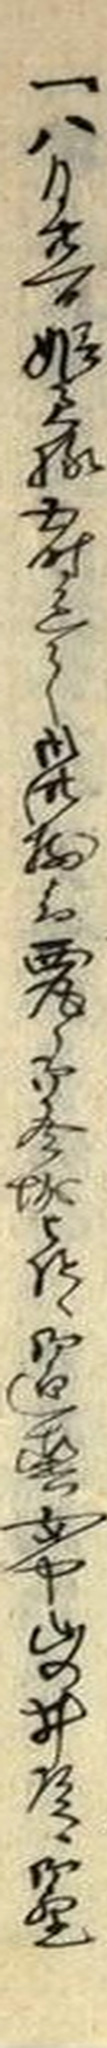一八月廿一日姫君様五時過之御供揃ニ而西丸御登城被遊候御迎輿女中山の井殿御逢
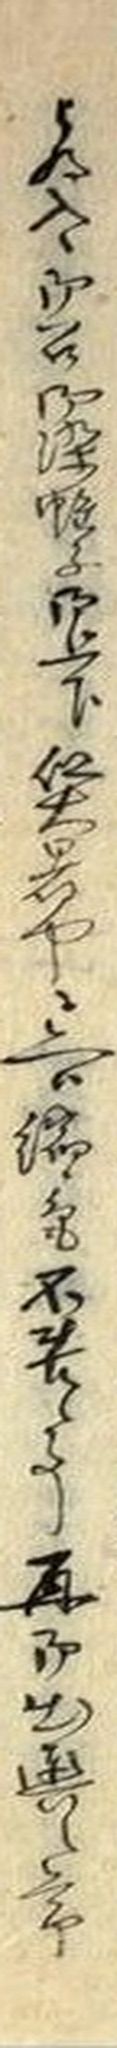被為入候御召御染帷子御上下但大暑中ニ候へハ縮ニ而も不苦候事再御出輿之節
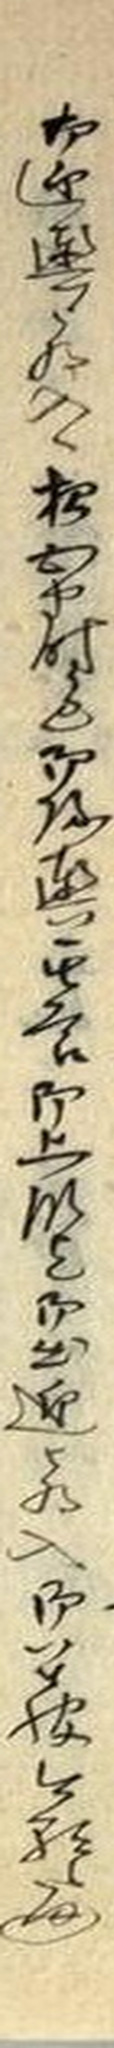御迎輿へ被為入候夜五半時過御帰輿其節御上段迄御出迎被為入御召服今朝之通
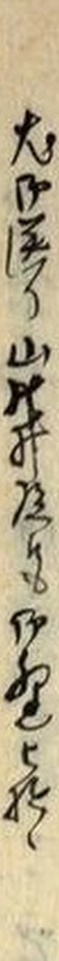尤御送り山野井殿江も御逢被遊候
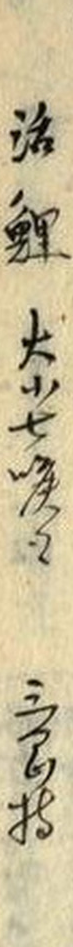活鯉大小七喉ツヽ三岡持

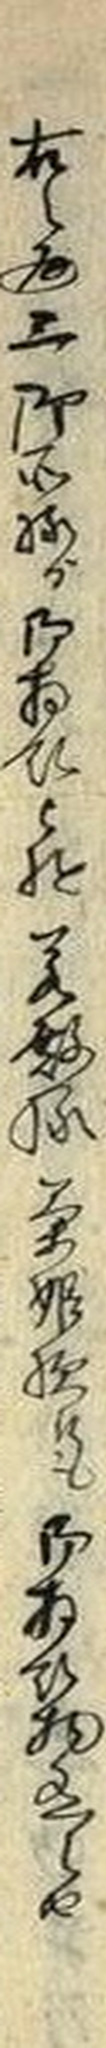右之通三御所様ゟ御拝領被遊若殿様菊姫様江も御拝領物有之由
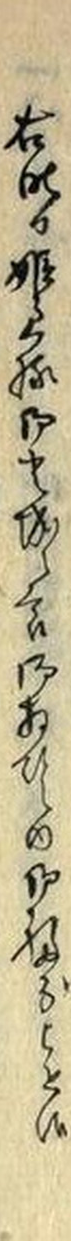右昨日姫君様御登城之節御拝領之内御移分被進之
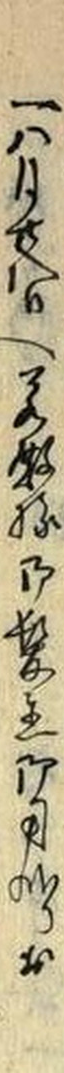一八月廿八日若殿様御髪置御用掛り於
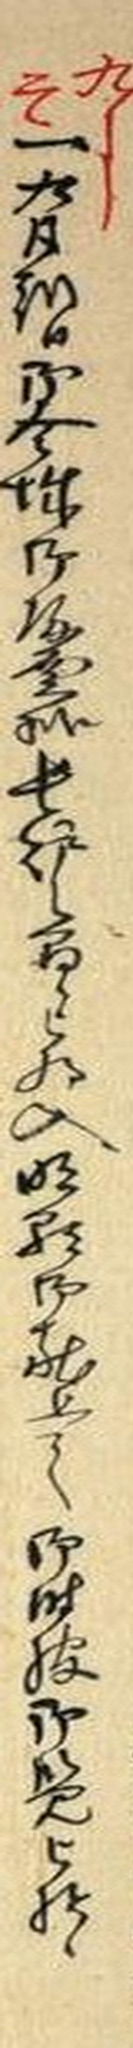一九月朔日御登城御帰殿掛長炉之間被為入明朝御献上之御時服御覧被遊候
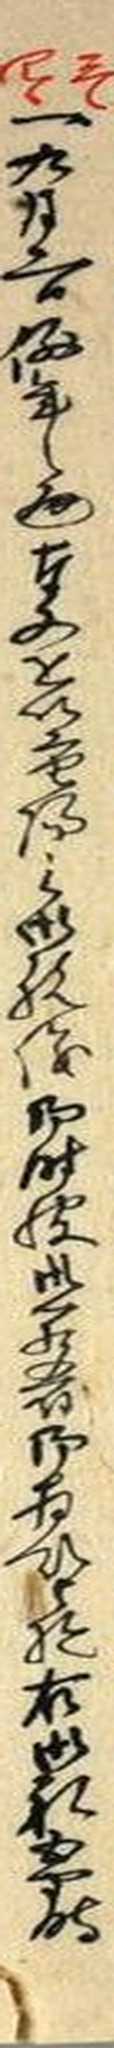一九月二日例年之通奉文を以重陽之御祝儀御時服御箱肴御拝領被遊右御礼五半時
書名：少傅日録抄（斉承付側向頭取日記、在府）
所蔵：福井県文書館 Fukui Prefectural Archives
